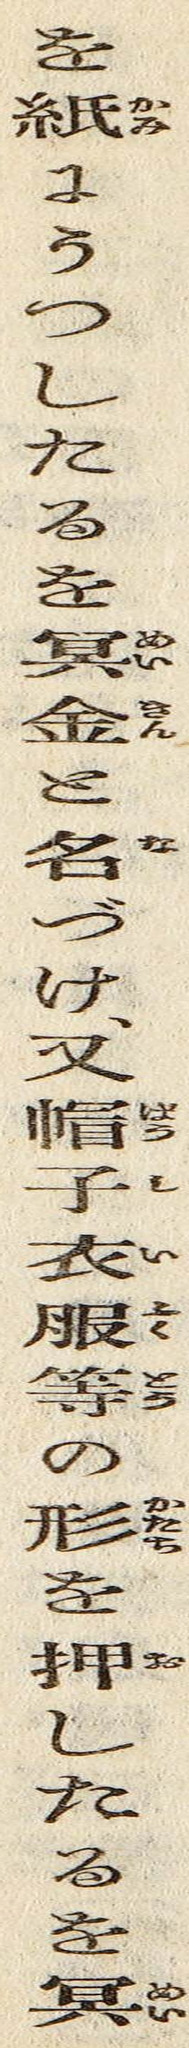を紙にうつしたるを冥金と名づけ、又帽子衣服等の形を押したるを冥
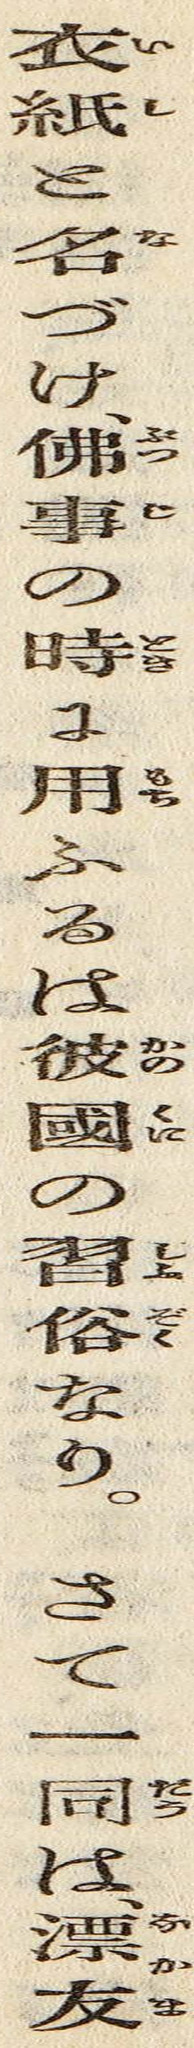衣紙と名づけ、仏事の時に用ふるは彼国の習俗なり。さて一同は、漂友
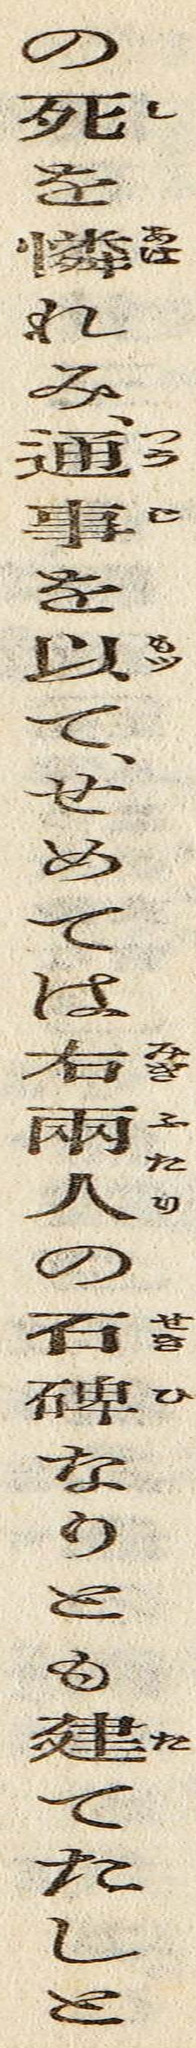の死を憐れみ、通事を以て、せめては右両人の石碑なりとも建てたしと
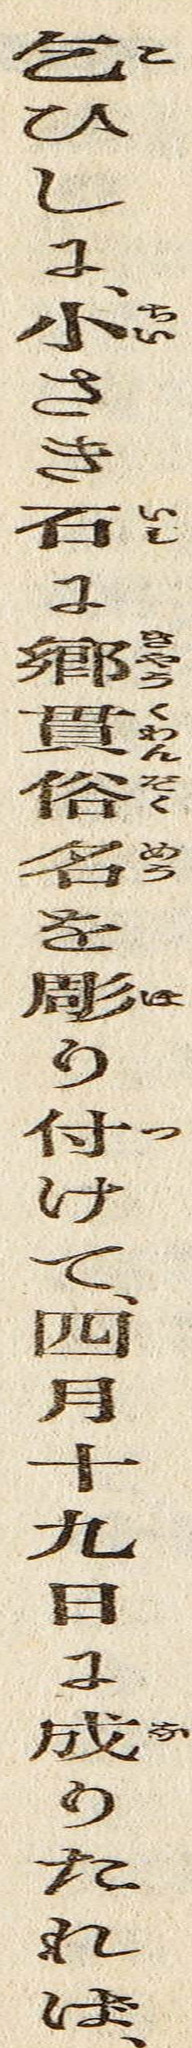乞ひしに、小さき石に郷貫俗名を彫り付けて、四月十九日に成りたれば、
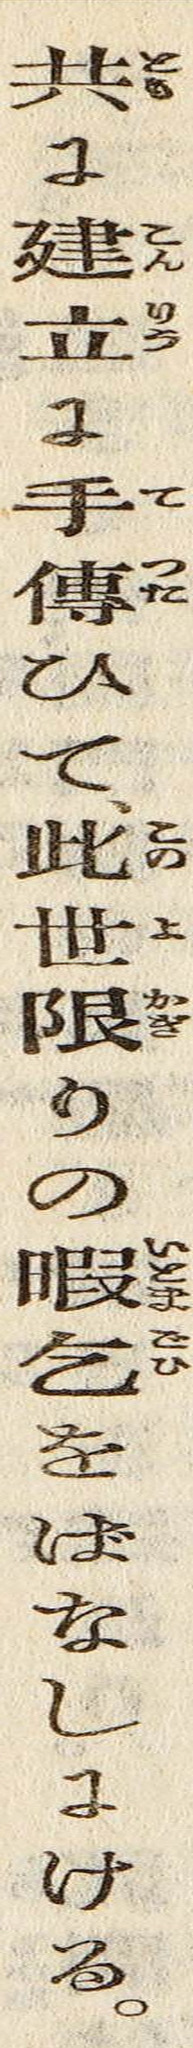共に建立に手伝ひて、此世限りの暇乞をばなしにける。
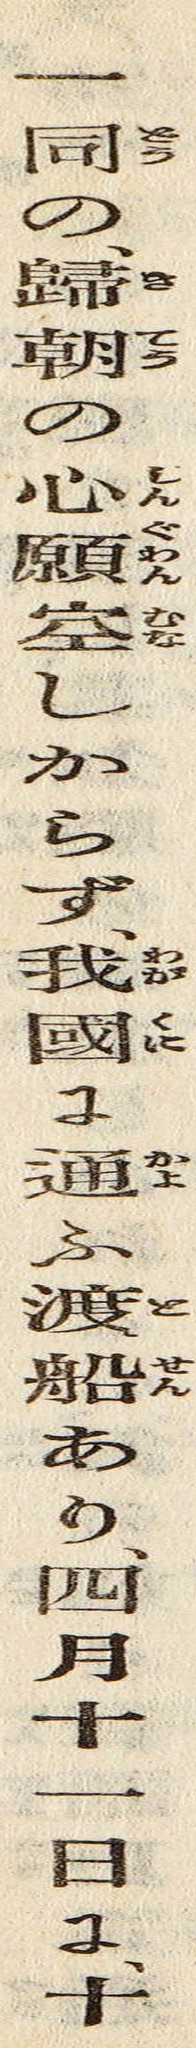一同の、帰朝の心願空しからず、我国にか通う渡船あり、四月十一日に、十
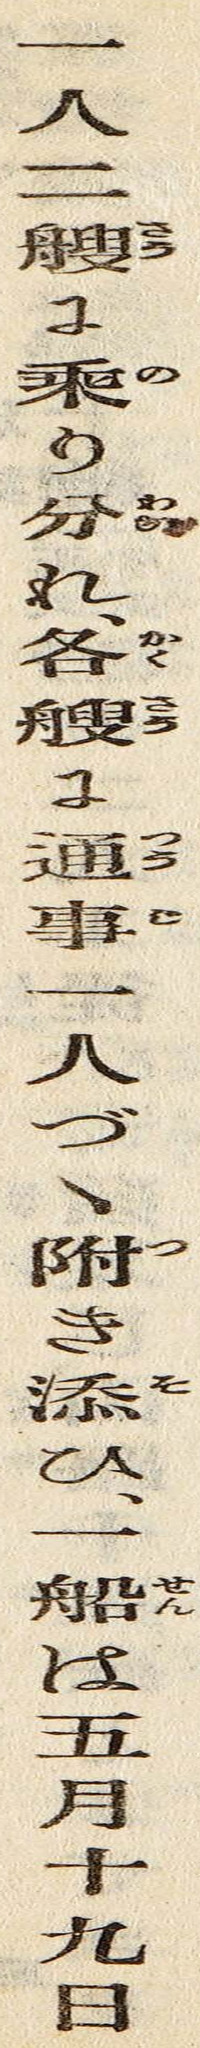一人二艘に乗り分れ、各艘に通事一人づヽ附き添ひ、一船は五月十九日
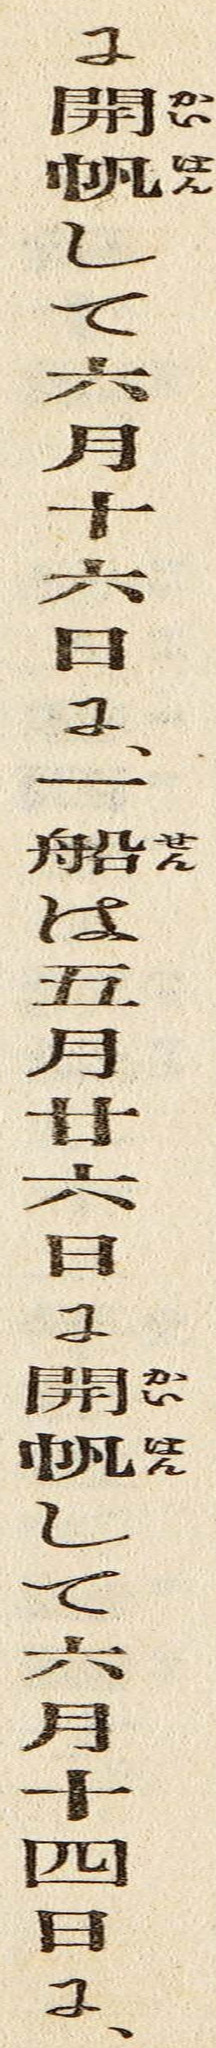に開帆して六月十六日に、一船は五月廿六日に開帆して六月十四日に、
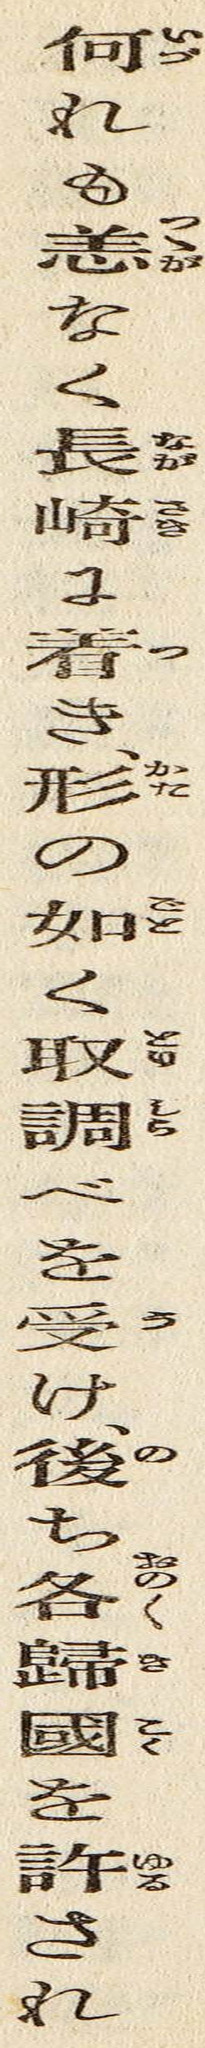何れも恙なく長崎に着き、形の如く取調べを受け、後ち各帰国を許され
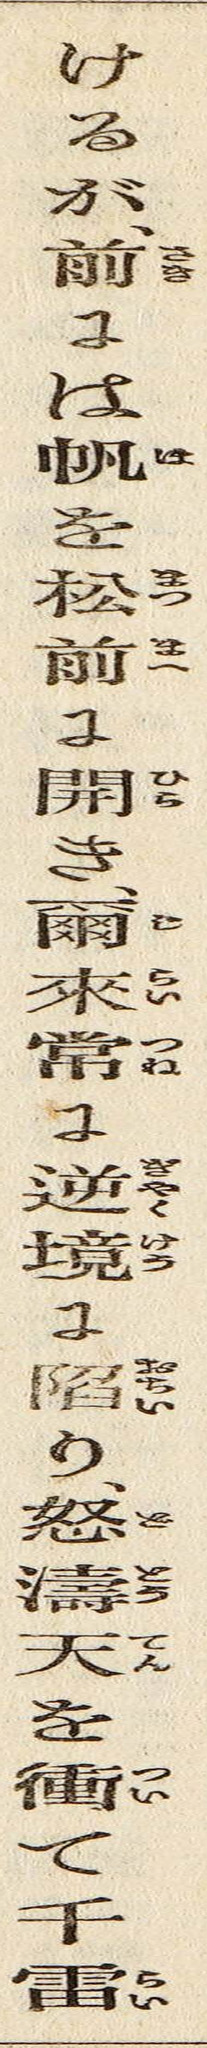けるが、前には帆を松前に開き、爾来常に逆境に陥り、怒涛天を衝て千雷
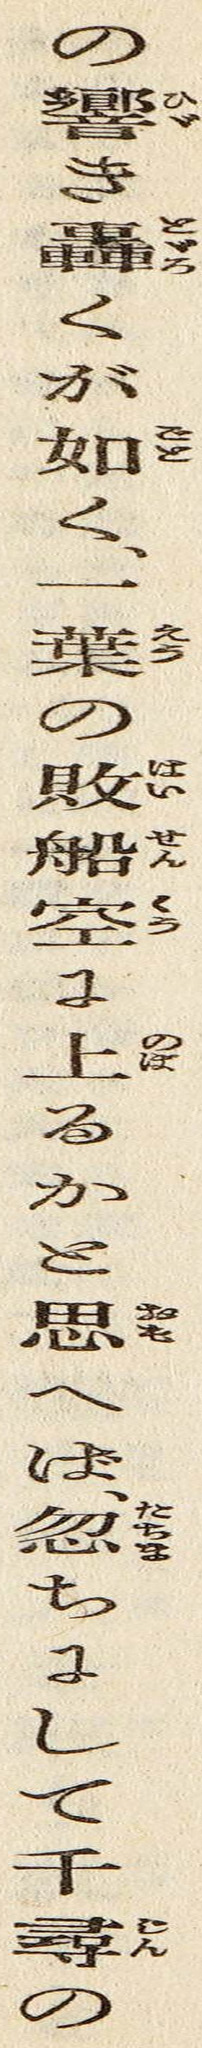の響き轟くが如く、一葉の敗船空に上るかと思へば忽ちにして千尋
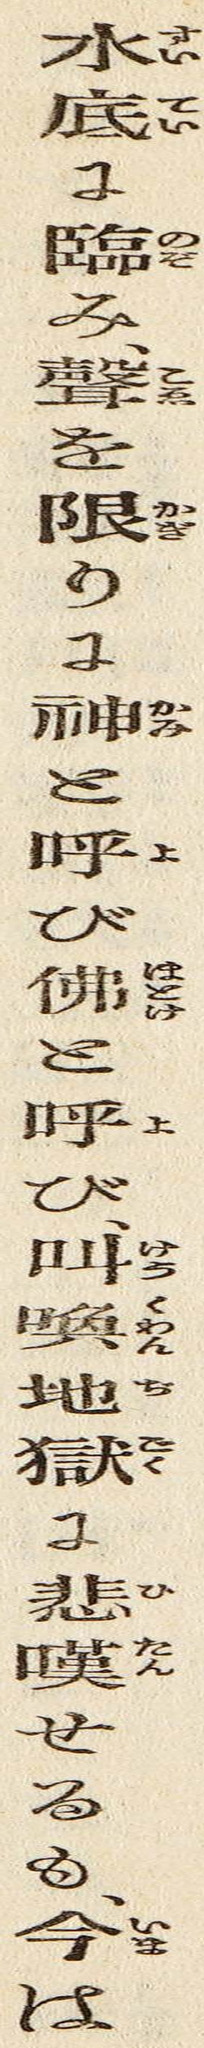水底に臨み、声を限りに神と呼び仏と呼び、叫喚地獄に悲嘆せるも、今は
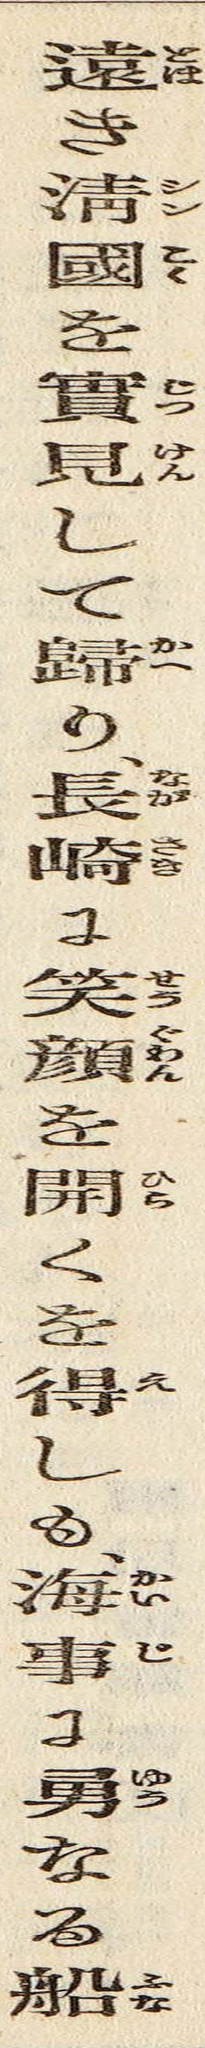遠き清国を実見して帰り、長崎に笑顔を開くを得しも、海事に勇なる船
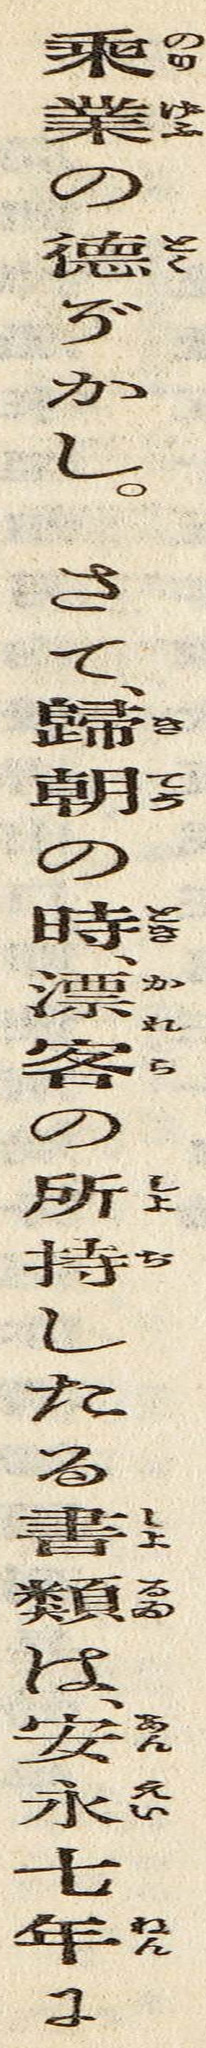乗業の徳ぞかし。さて、帰朝の時、漂客の所持したる書類は、安永七年に
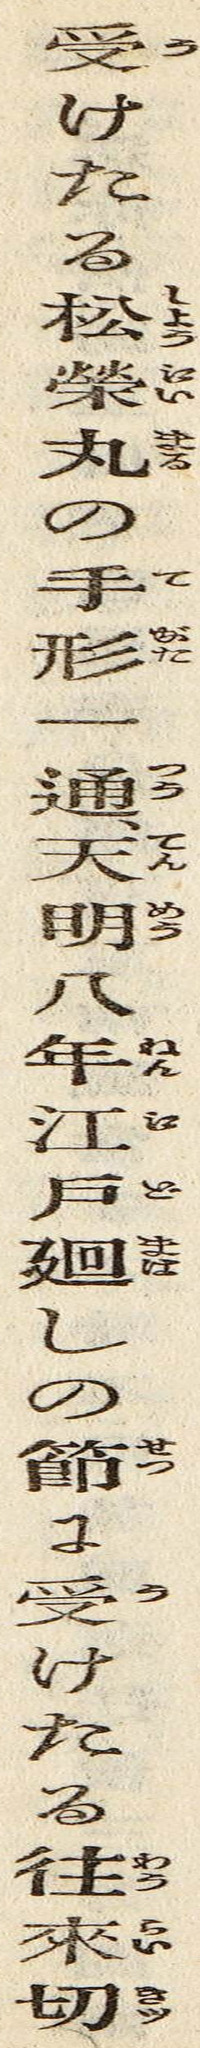受けたる松栄丸の手形一通、天明八年江戸廻しの節に受けたる往来切
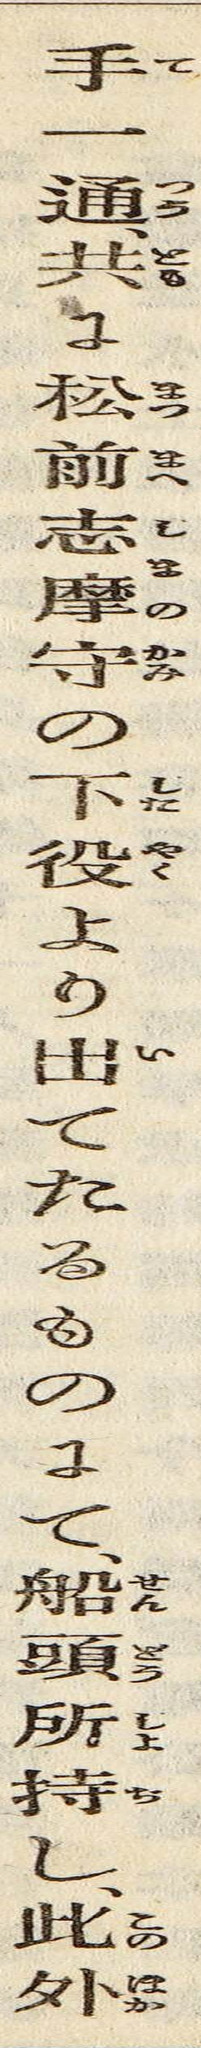手一通、共に松前志摩守の下役より出てたるものにて、船頭所持し、此外
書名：日本漂流譚
